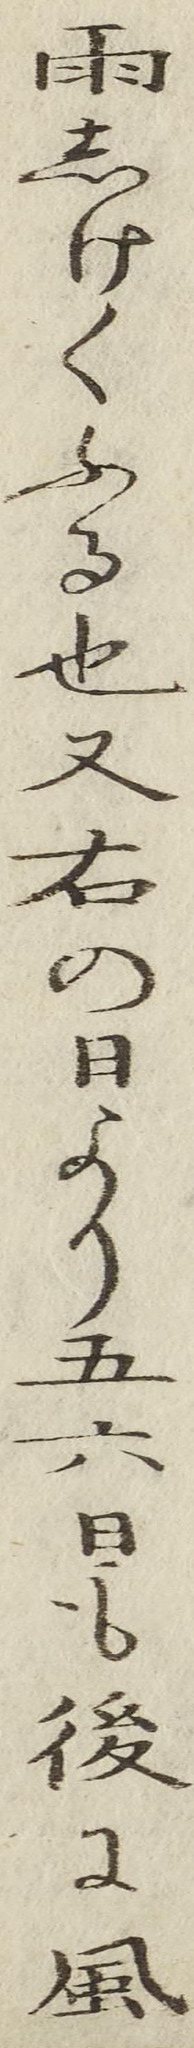雨しけくふる也又右の日より五六日も後に風
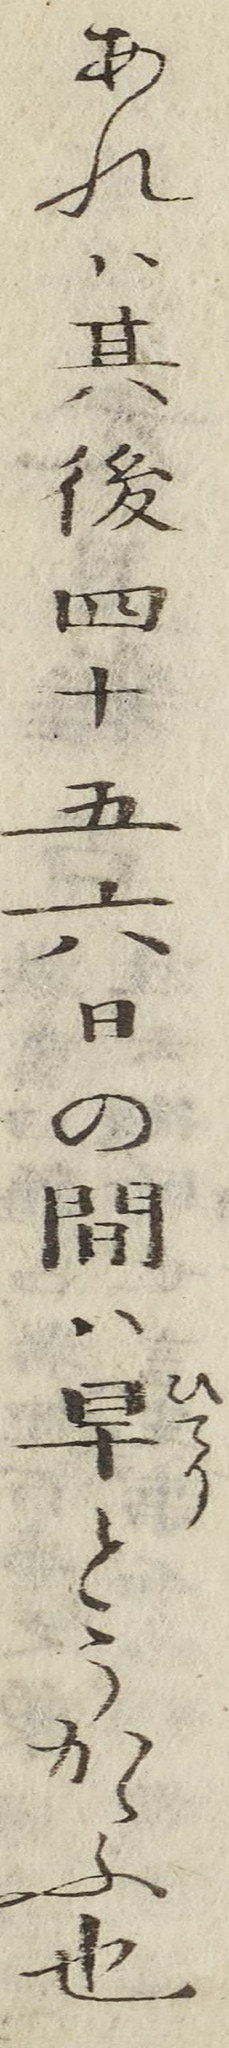あれは其後四十五六日の間は旱とうかゝふ也

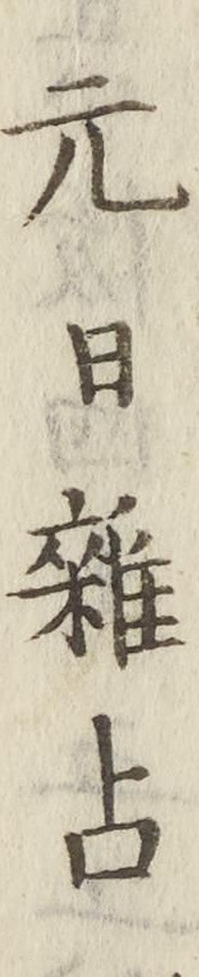元日雑占
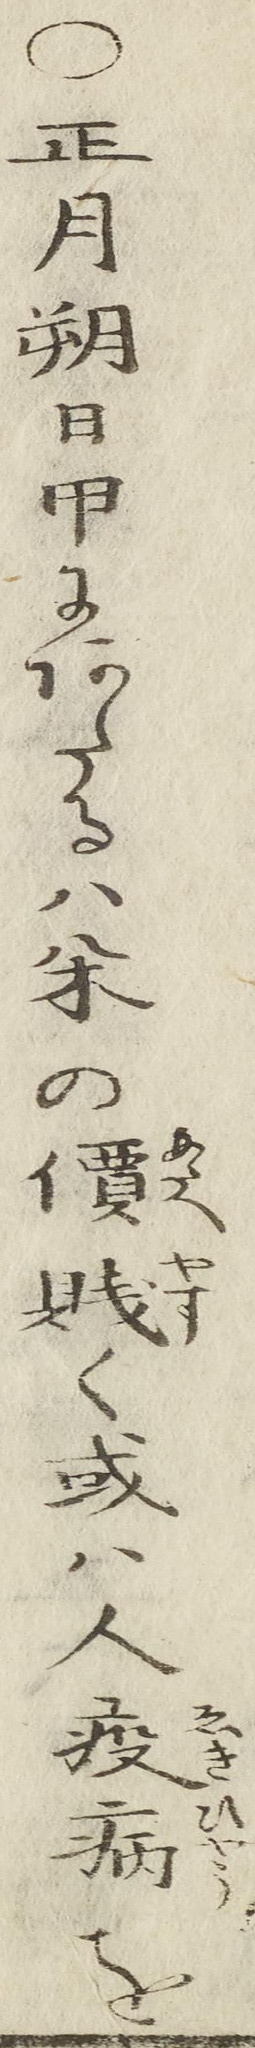〇正月朔日甲にあたるは米の価賤く或は人疫病を
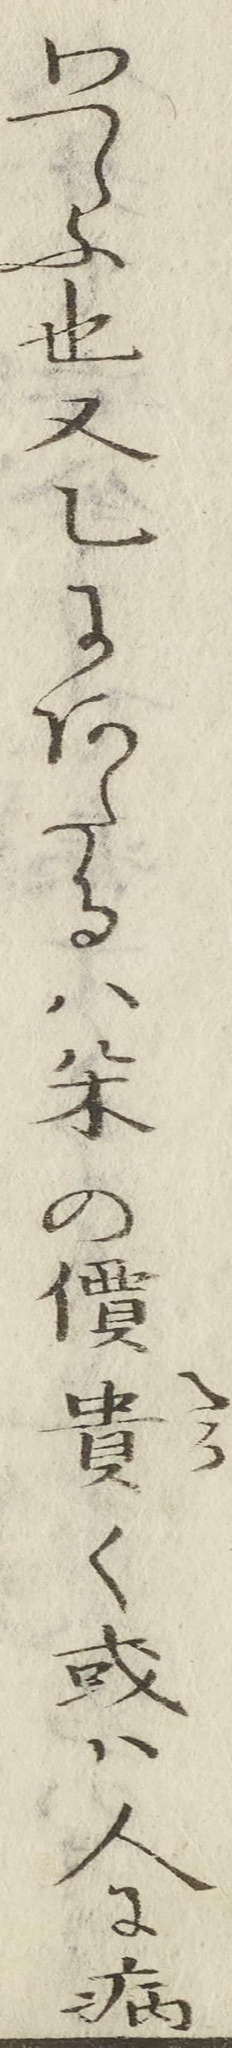わつらふ也乙にあたるは米の価貴く或は人に病
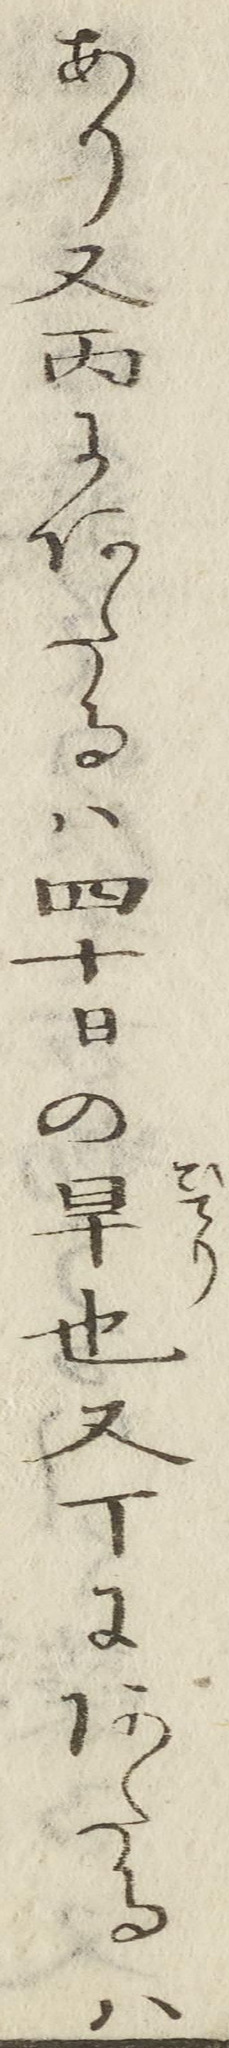あり又丙にあたるは四十日の旱也又丁にあたるは
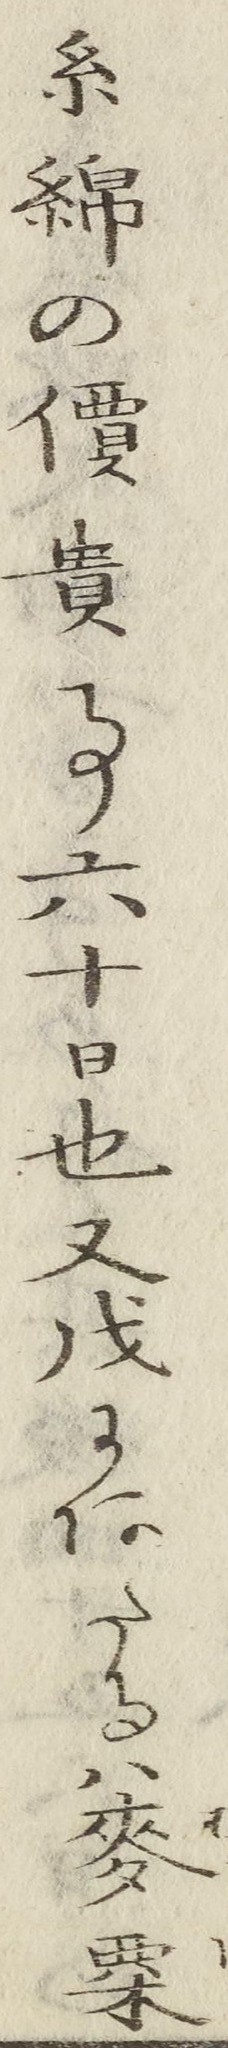糸綿の価貴事六十日也又戊にあたるは麦粟
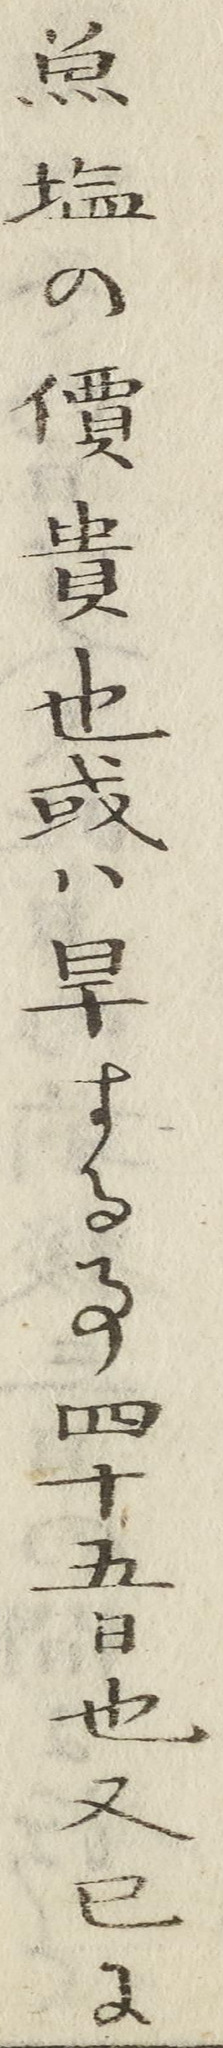魚塩の価貴也或は旱する事四十五日也又己に
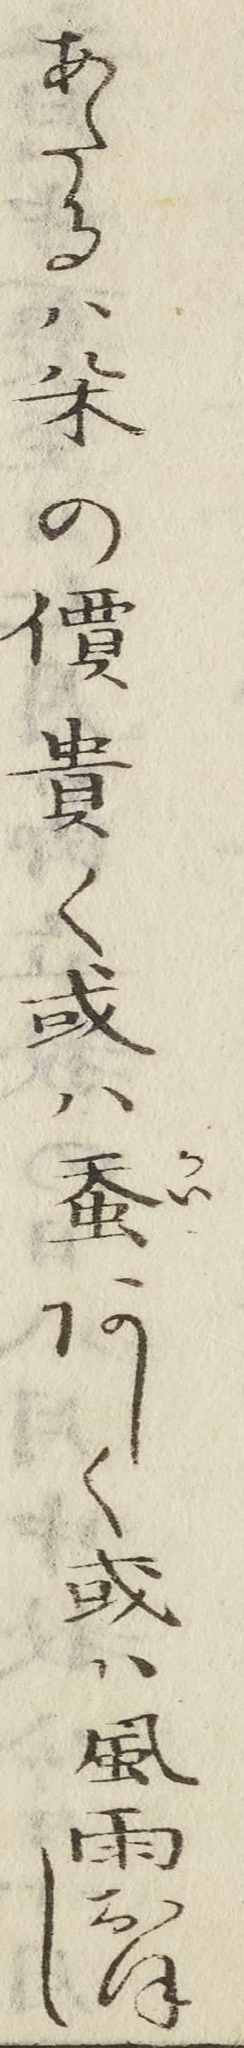あたるは米の価貴く或は蚕あしく或は風雨おほし
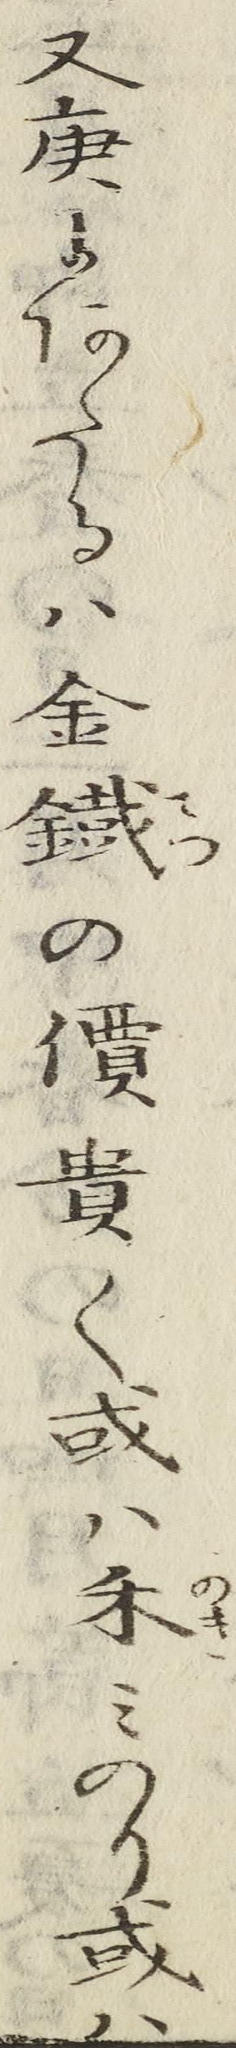又庚にあたるは金鉄の価貴く或は禾みのり或は
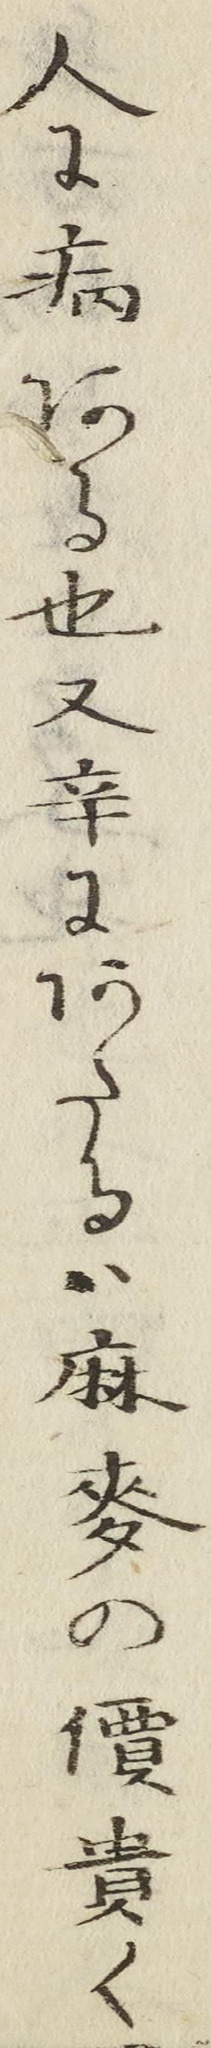人に病ある也又辛にあたるは麻麦の価貴く
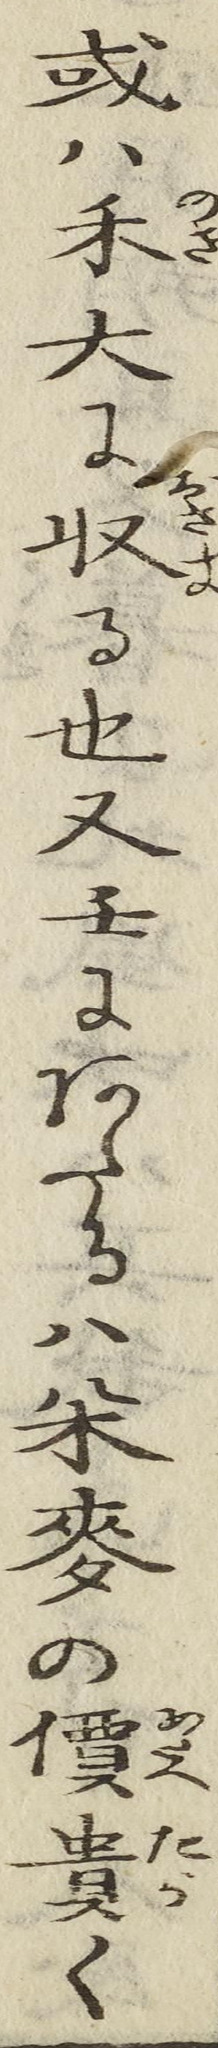或は禾大に収る也又壬にあたるは米麦の価貴く
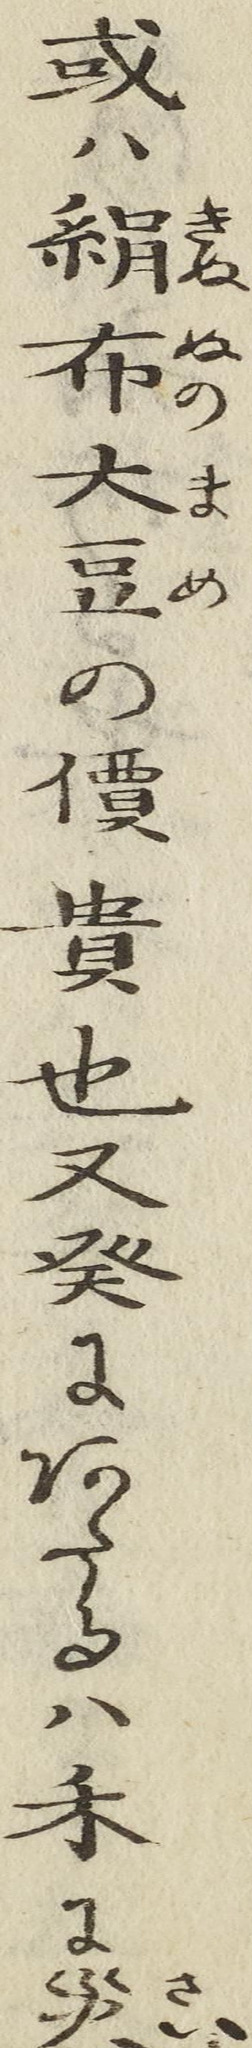或は絹布大豆の価貴也又癸にあたるは禾に災
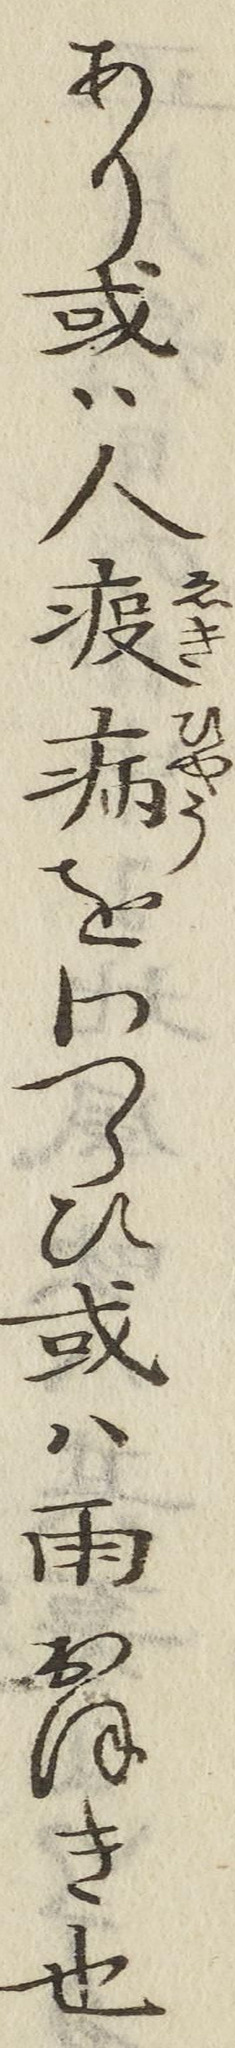あり或は人疫病をわつらひ或は雨おほき也
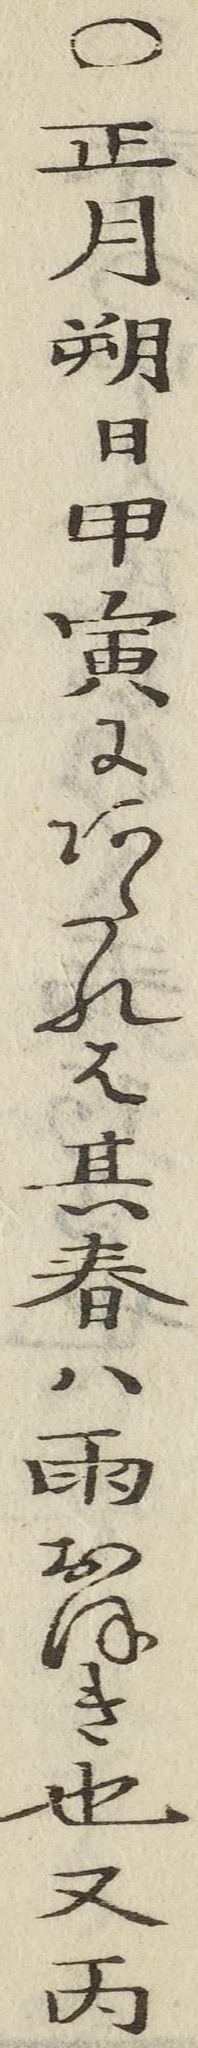〇正月朔日甲寅にあたれは其春は雨おほき也又丙
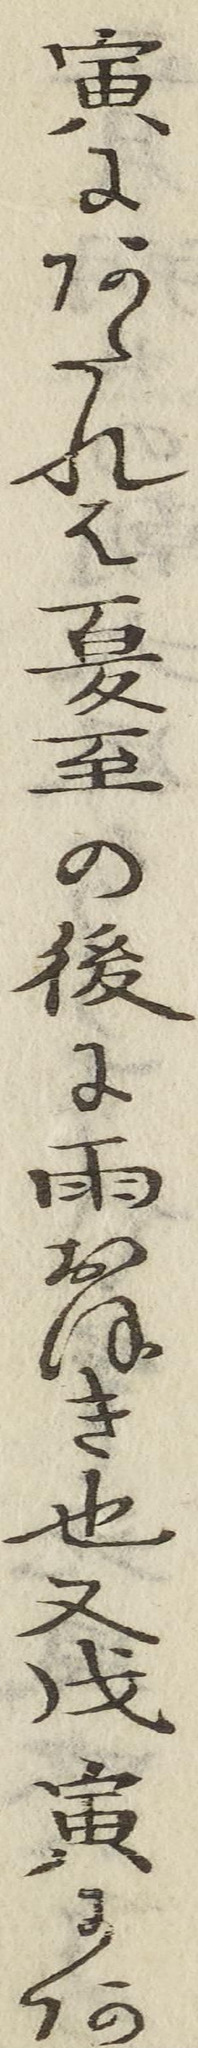寅にあたれは夏至の後に雨おほき也又戊寅にあ
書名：天時占候　二
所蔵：東京大学地震研究所図書室 Earthquake Research Institute Library, The University of Tokyo, JAPAN
